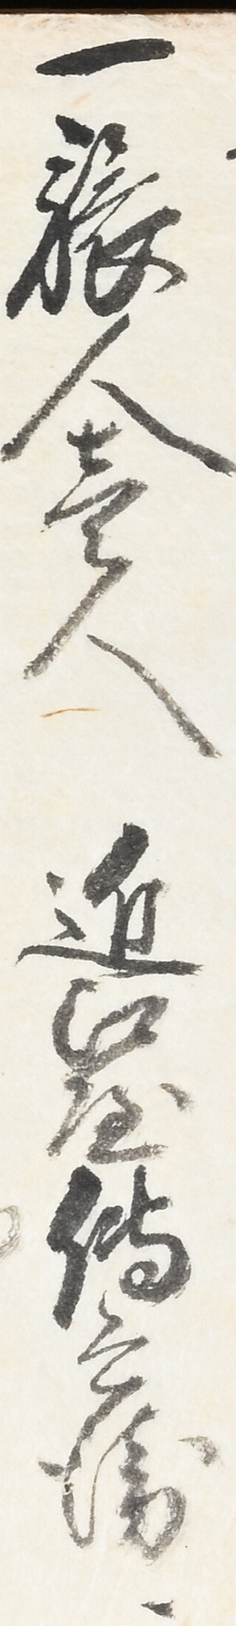一旅人壱人近江屋伝兵衛・
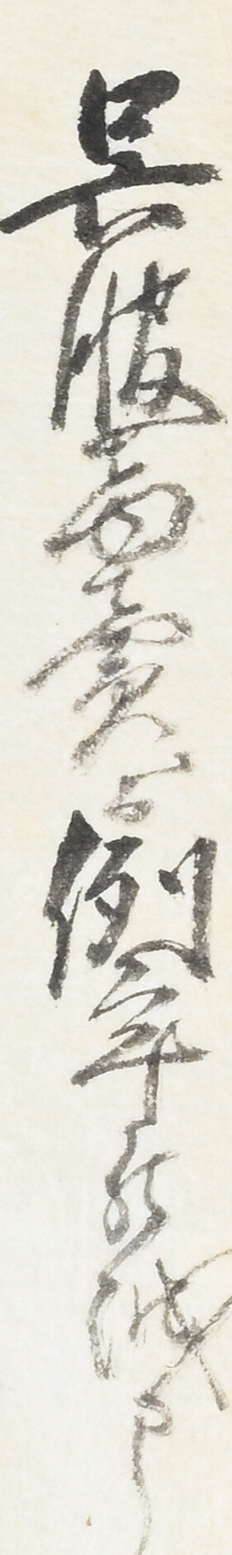呉服商売ニ而例年罷越申候
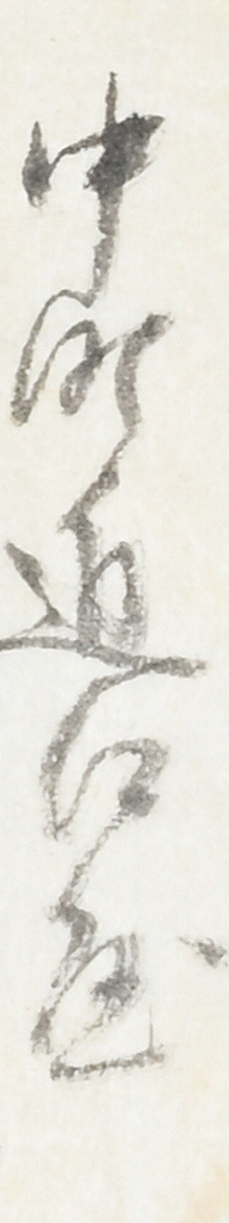中町近江屋
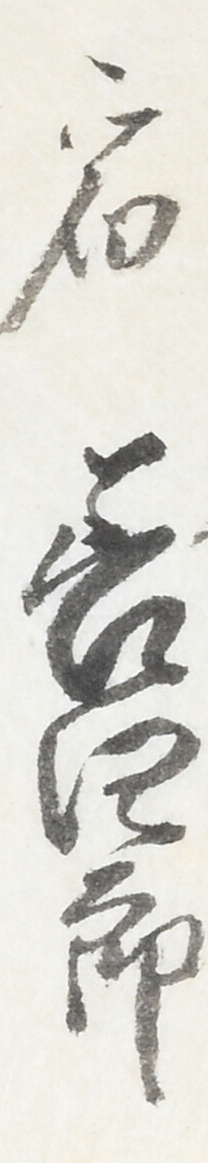宿善四郎
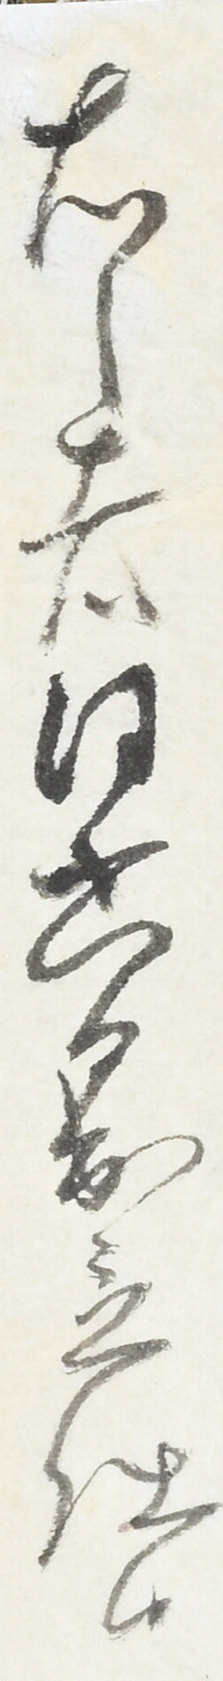右之者同六日出立仕候

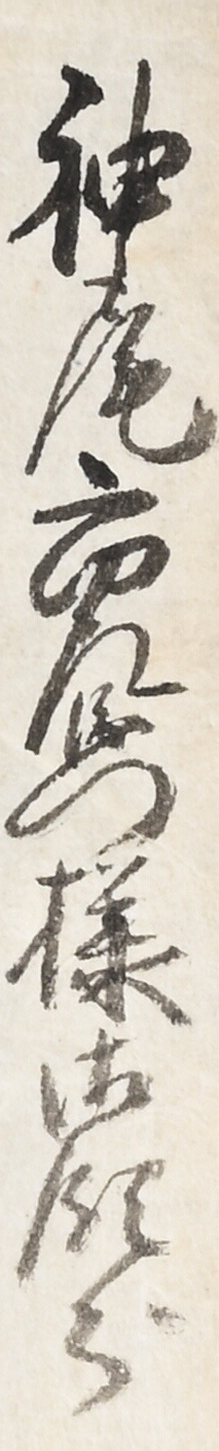神尾市左衛門様御領分
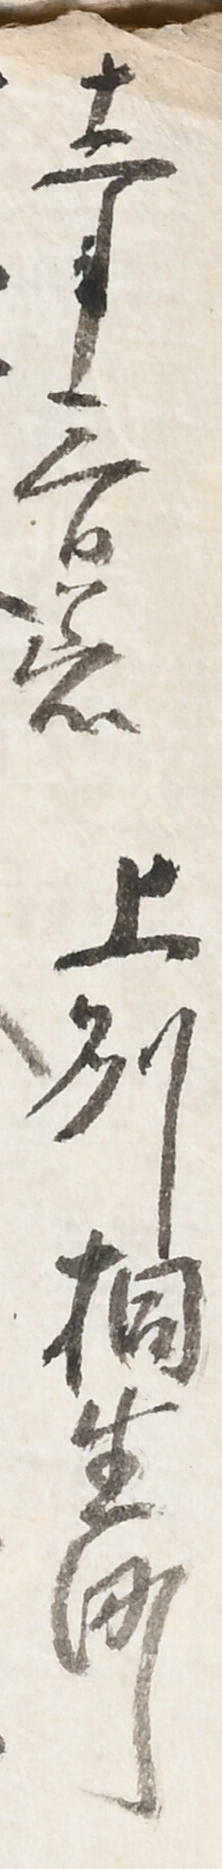十二月三日着上州桐生町
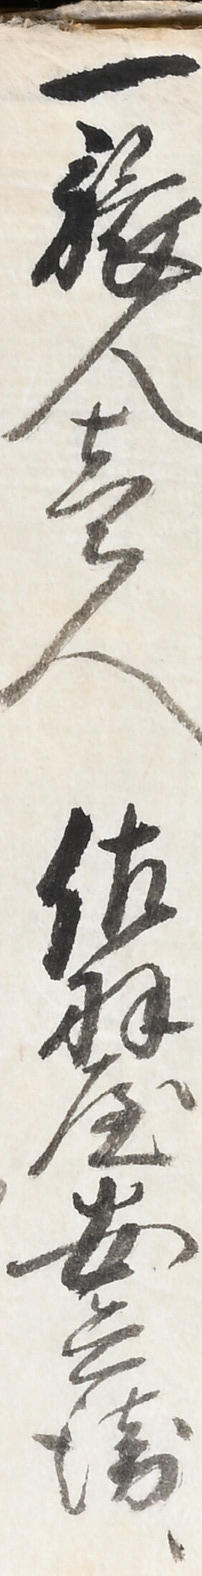一旅人壱人佐羽屋安兵衛・
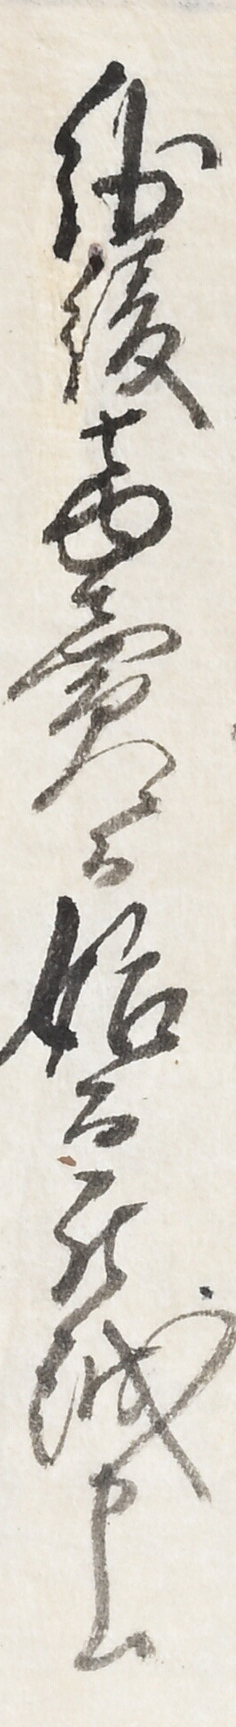紗後商売ニ而始而罷越申候
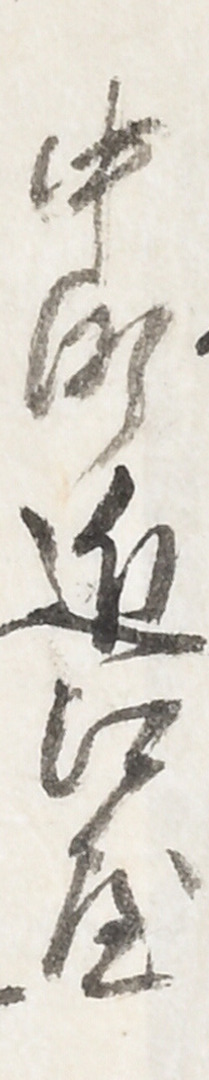中町近江屋
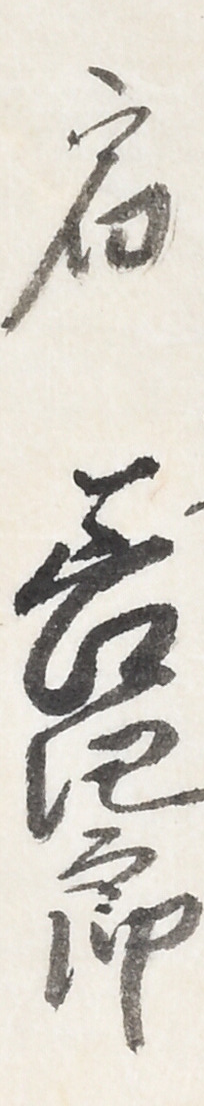宿善四郎
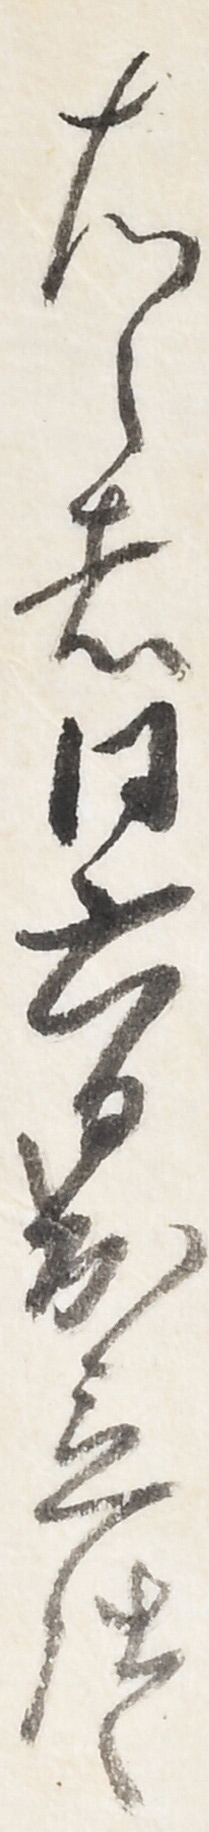右之者同六日出立仕候
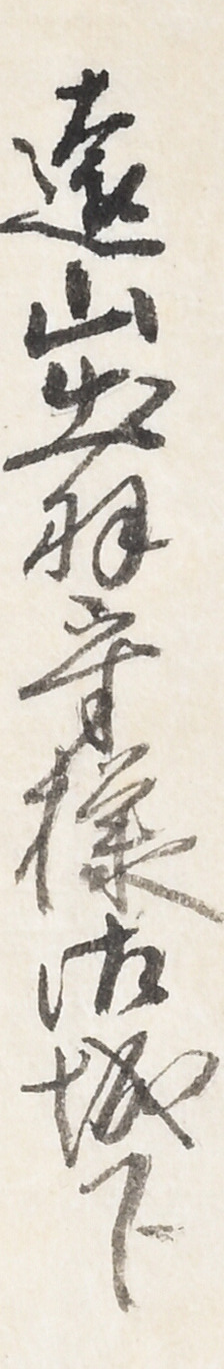遠山出羽守様御城下
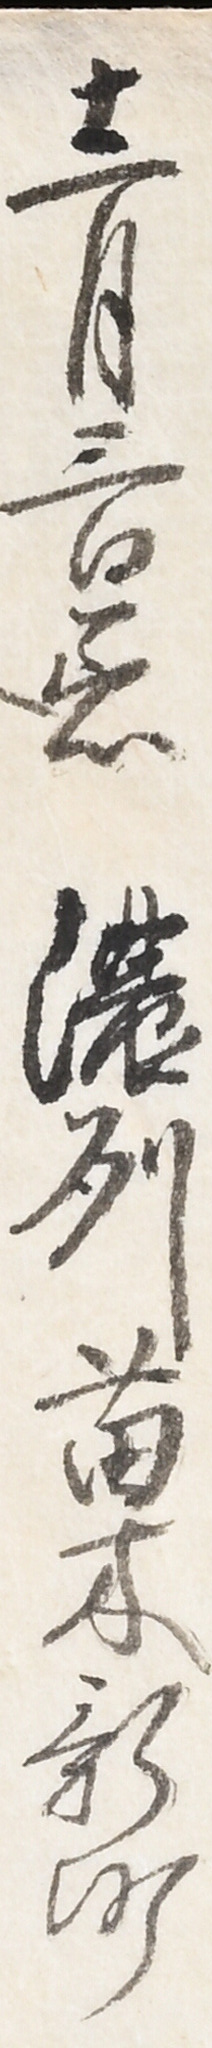十二月三日着濃州苗木新町
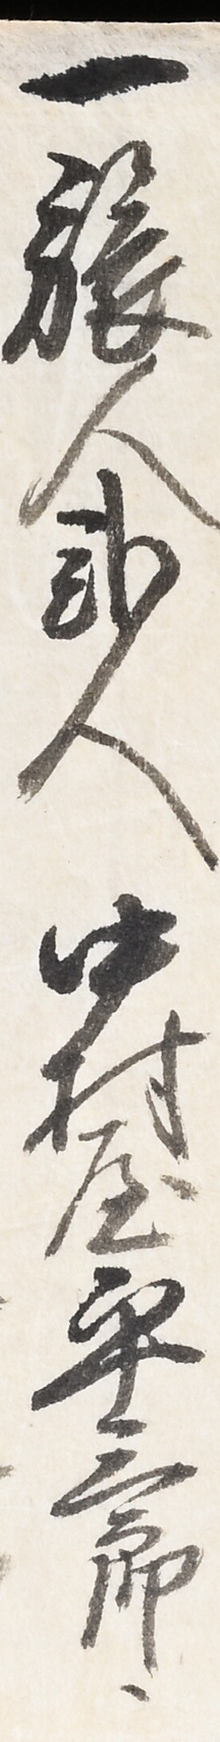一旅人弐人中村屋平三郎・
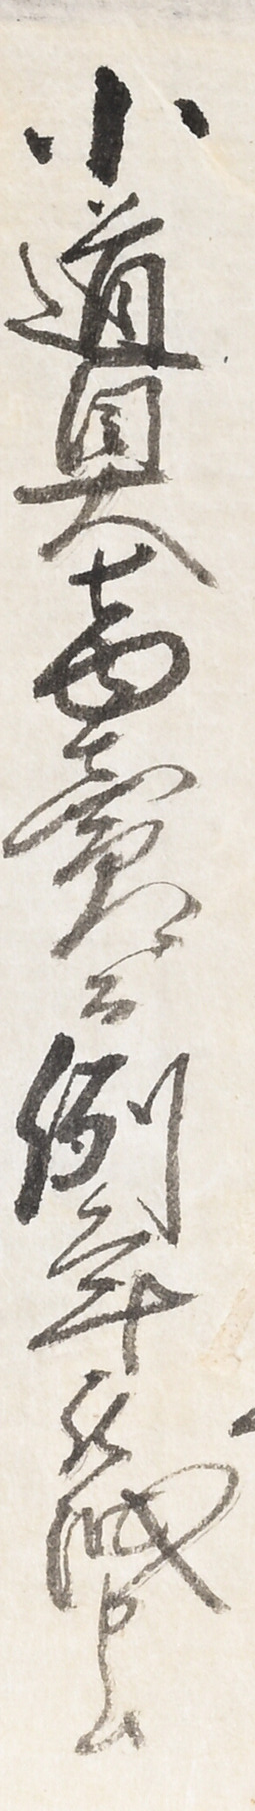小道具商売ニ而例年罷越申候
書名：旅人泊控帳
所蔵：伊那市立高遠町図書館・合同会社AMANE
